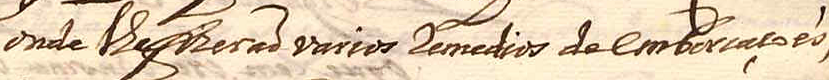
onde lhe fizeraõ varios Remedios de emborcaçoes̄,
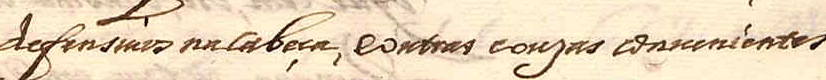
defensiuos na cabeça, e outras couzas conuenientes
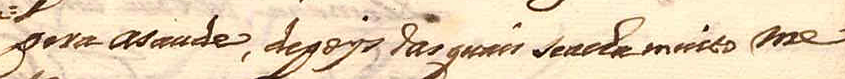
para a saude, depoys das quais se acha muito me
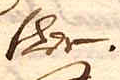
lhor.
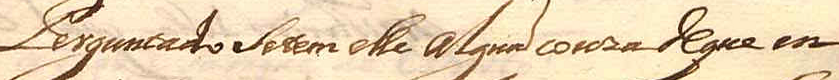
Perguntado se tem elle alguā couza de que en
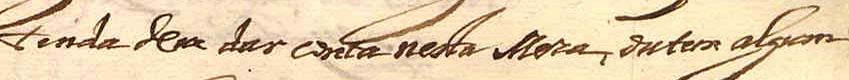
tenda deue dar conta nesta Meza, ou tem algum
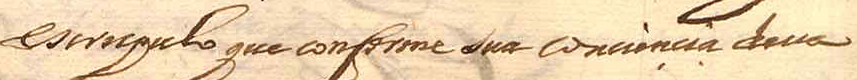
escrupulo que conforme sua conciênçia deua
